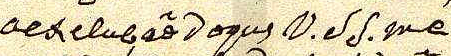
a execuçaõ do que V. SS. me
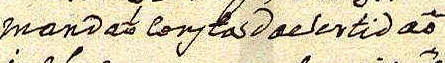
mandaõ consta da sertidaõ
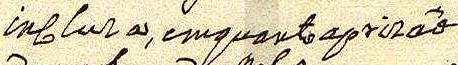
inCluza, emquanto a prizaõ
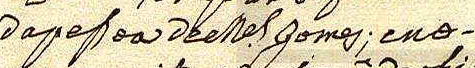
da pessoa de M.el Gomes; e no
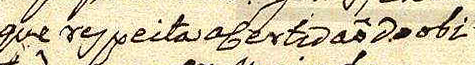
que respeita a Certidaõ do obi
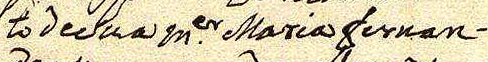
to de sua m.er Maria fernan
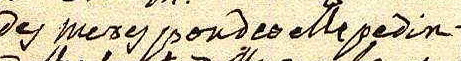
des me respondeo elle pedin
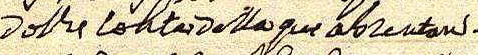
dolhe conta della que abzentan.
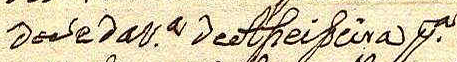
dose da v.a de Asseisseira p.a
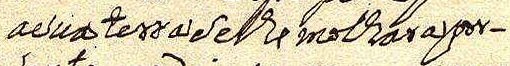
a sua terra se lhe molhara por
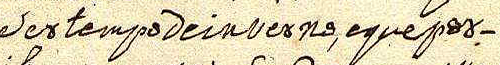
ser tempo de inverno, e que por
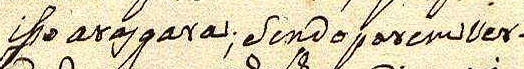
isso a rasgara; sendo porem ver
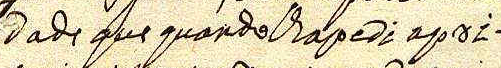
dade que quando lha pedi a pri
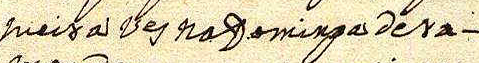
meira ves no Domingo de ra
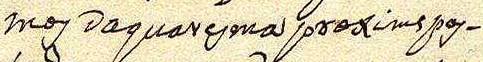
mos da quaresma proxima pas
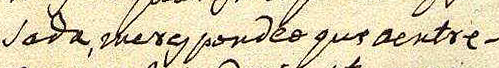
sada, me respondeo que a entre
